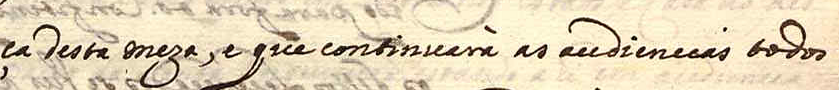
ça desta meza, e que continuarà as audiencias todos
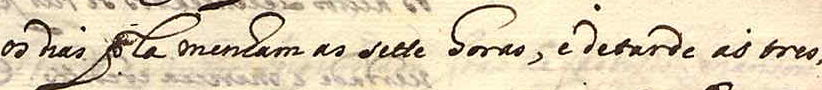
os dias p̄la menham as sette horas, e de tarde as tres,
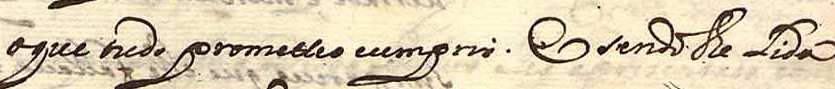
o que tudo prometteo cumprir. E sendolhe Lida
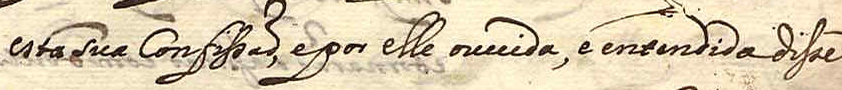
esta sua Confissaõ, e por elle ouuida, e entendida disse
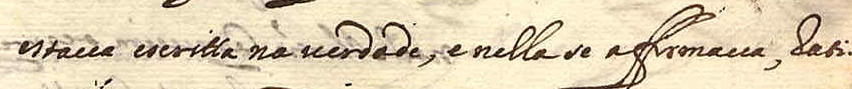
estaua escritta na uerdade, e nella se affirmaua, Rati
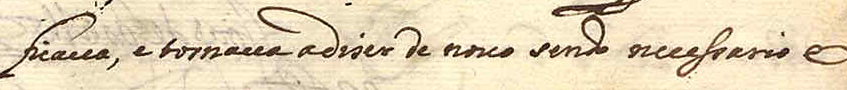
ficaua, e tornaua a dizer de nouo sendo necessario e
